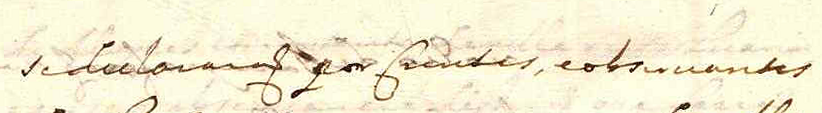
se declararaõ por Crentes, e obseruantes
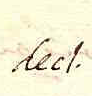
decl.
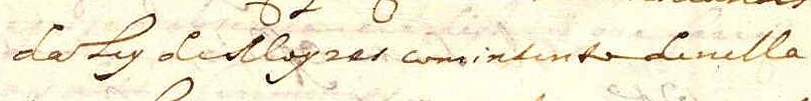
da Ley de Moyzes com intento de nella
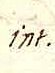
int.
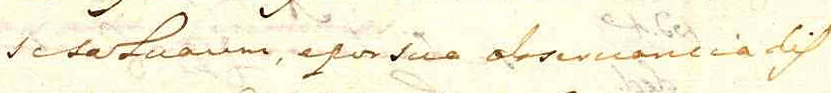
se saluarem, e por sua obseruancia dis
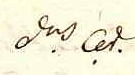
d.as cer.
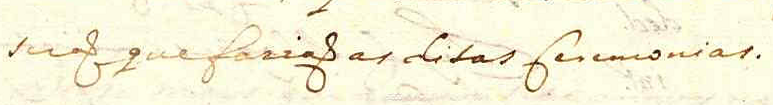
seraõ que faziaõ as ditas Ceremonias.
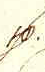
tpō.
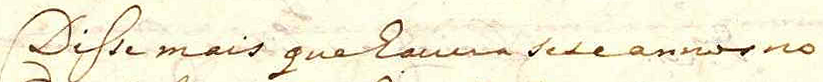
Disse mais que hauera sete annos no
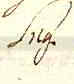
Lug.
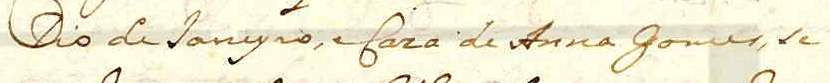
Rio de Ianeyro, e Caza de Anna Gomes, se
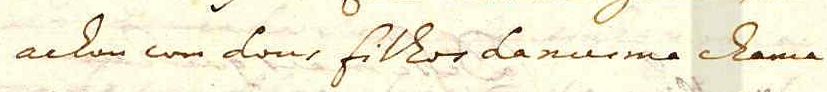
achou com dous filhos da mesma chama
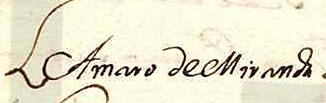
L Amaro de Miranda
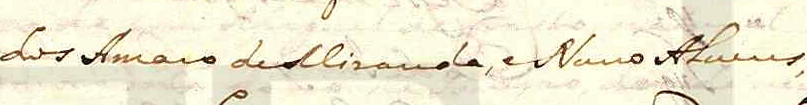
dos Amaro de Miranda, e Nuno Alueres,
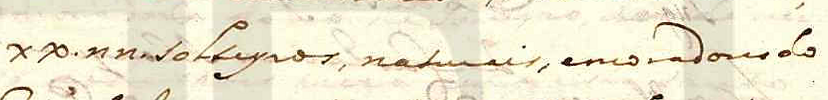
xx. nn. solteyros, naturais, e moradores do
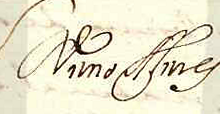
Nuno Alures
